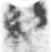紡
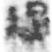○（表）
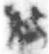紫
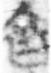裏
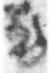○（貂）
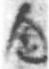定
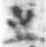之
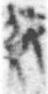○（紛）
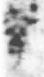韌
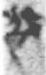○（紛）
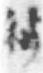紫
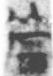○（席）
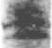二
